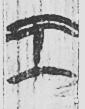王
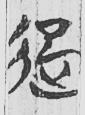起
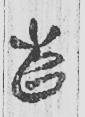{山𡴎}
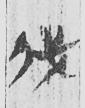伐
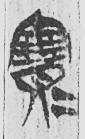賽=
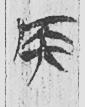侯
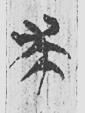求
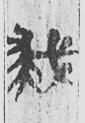{求戈}
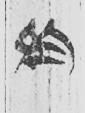於
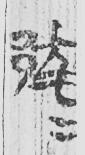○（蔡）
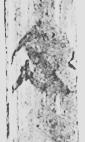哀
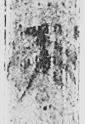侯
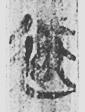{行幺止}
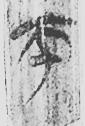帀
